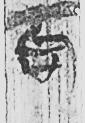句
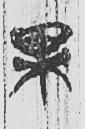果
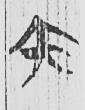內
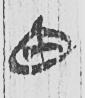囟
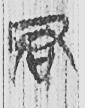君
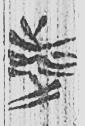涉
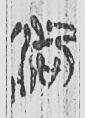河
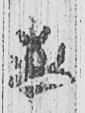至
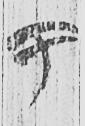于
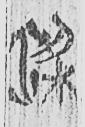梁
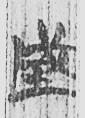城
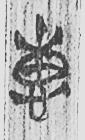惠
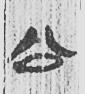公
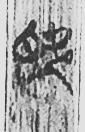既
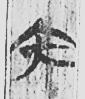內
